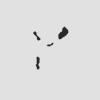又
